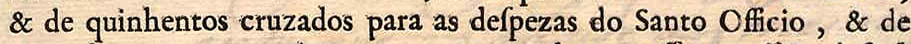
& de quinhentos cruzados para as despezas do Santo Officio, & de
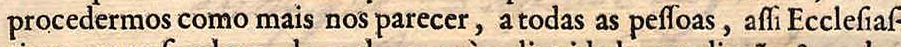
procedermos como mais nos parecer, a todas as pessoas, assi Ecclesias
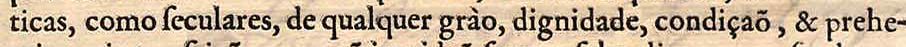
ticas, como seculares, de qualquer grào, dignidade, condiçaõ, & prehe
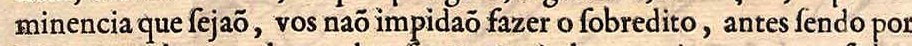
minencia que sejaõ, vos naõ impidaõ fazer o sobredito, antes sendo por
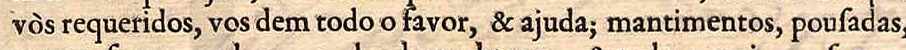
vòs requeridos, vos dem todo o favor, & ajuda; mantimentos, pousadas,
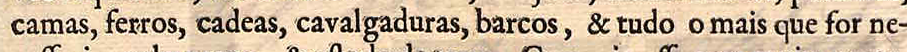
camas, ferros, cadeas, cavalgaduras, barcos, & tudo o mais que for ne
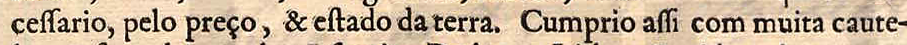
cessario, pelo preço, & estado da terra. Cumprio assi com muita caute
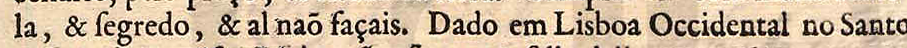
la, & segredo, & al naõ façais. Dado em Lisboa Occidental no Santo
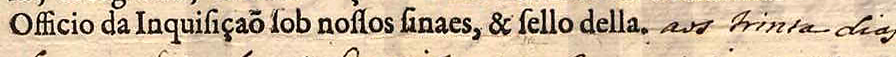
Officio da Inquisiçaõ sob nossos sinaes, & sello della. aos trinta dias
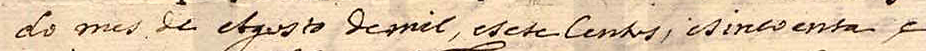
do mes de Agosto de mil, e setecentos, e sincoenta, e
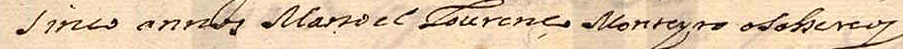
sinco annos Manoel Lourenço Monteyro o sobscrevj
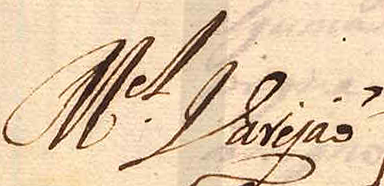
M.el Varejaõ
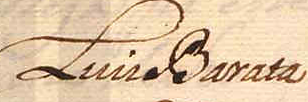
Luiz Barata
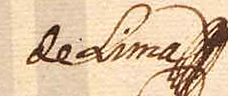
de Lima
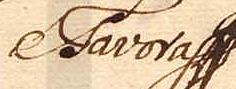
e Tavora
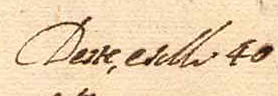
Deste, e sello 40
